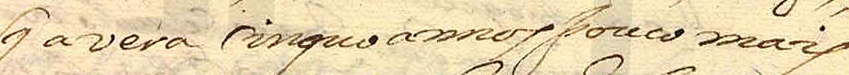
q̄ avera cinquo annos pouco mais
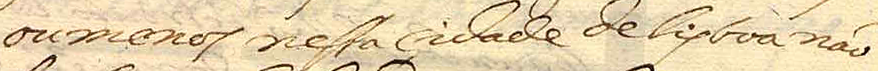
ou menos nesta çidade de lisboa naõ
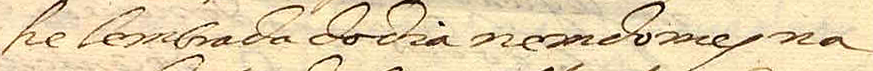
he lembrada do dia nem do mes na
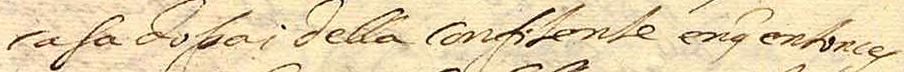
casa do pai della confitente en q̄ entonçes
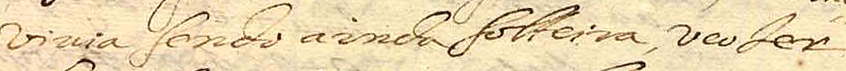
viuia sendo ainda solteira, veo ter
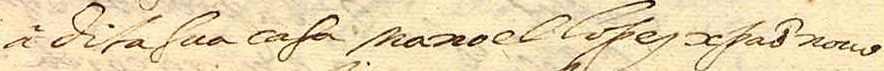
á dita sua casa manoel lopes xpaõ nouo
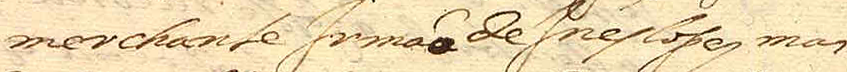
merchante Jrmaõ de Jnes lopes mai
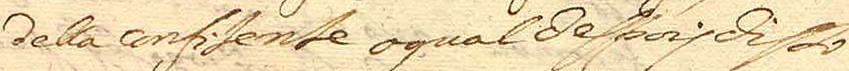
della confitente o qual despois disto
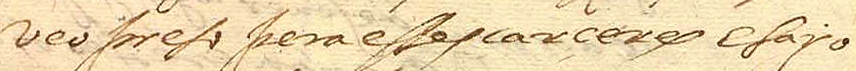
veo preso pera estes carçeres E sayo
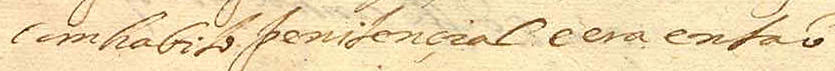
com habito penitençial e era entaõ
